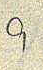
9
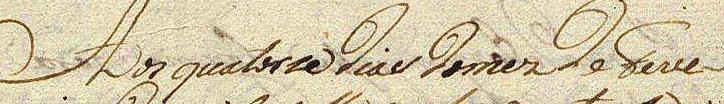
Aos quatorze dias do mez de Feve
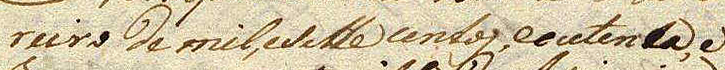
reiro de mil, e settecentos, e outenta, e
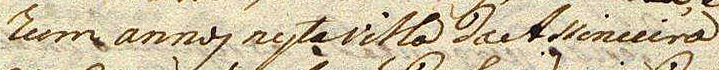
hum annos nesta villa da Assinceira
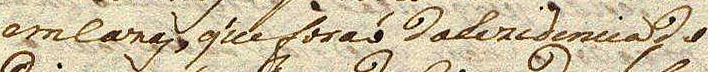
em cazas, que foraõ da Rezidencia do
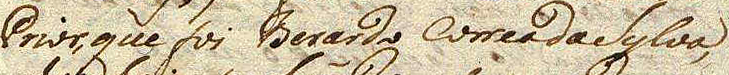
Prior, que foi Berardo Correa da Sylva,
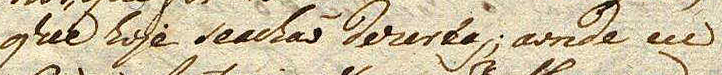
que hoje se achaõ dezertas; aonde eu
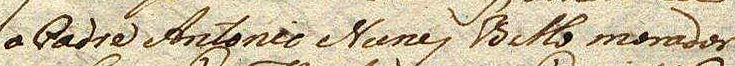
o Padre Antonio Nunes Bello morador
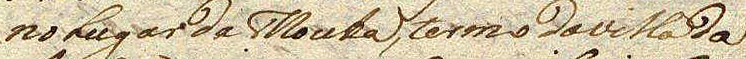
no Lugar da Mouta, termo da villa da
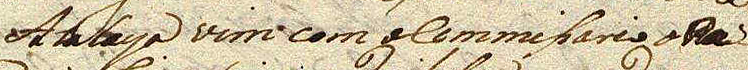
Atalaya vim com o Commissario o Pa
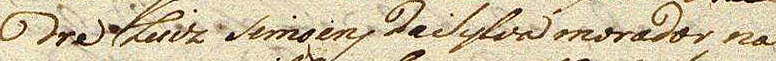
dra Luiz Simoens da Sylva morador na
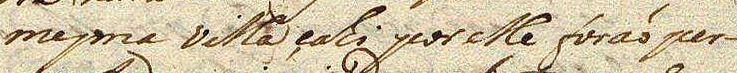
mesma villa e ahi por elle foraõ per
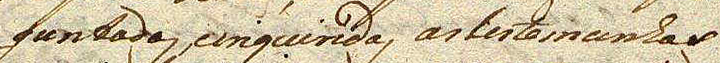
guntadas, e inquiridas as testemunhas
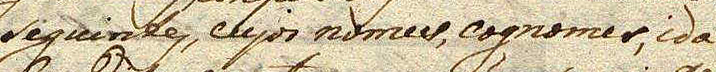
seguintes, cujos nomes, cognomes, ida
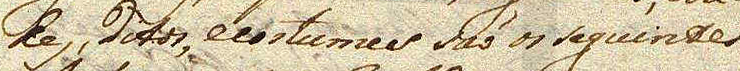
tes, ditos, e costumes saõ os seguintes
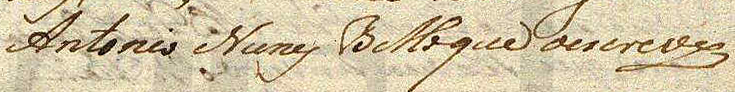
Antonio Nunes Bello que o escrevy
